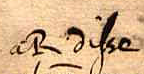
a R disse
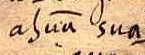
a hūa sua
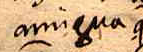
amigua q̄
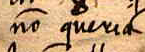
n̄o queria
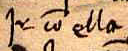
Jr cō ella
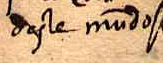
deste mūdo
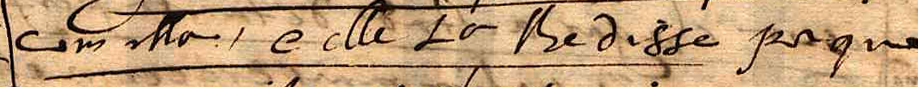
com ella, e elle ta lhe disse porque
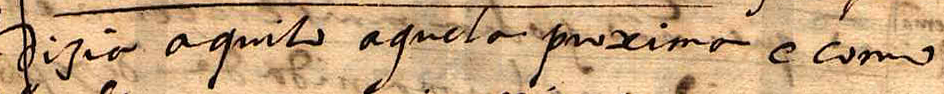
dizia aquilo aquela proxima e como
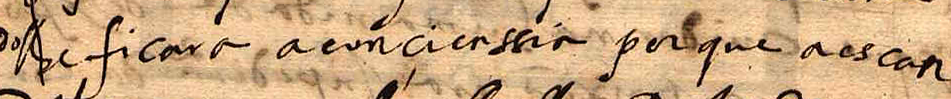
lhe ficara a concienssia porque a escan
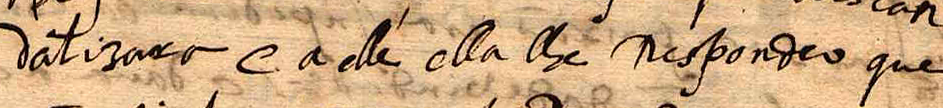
dalizara e a elle ella lhe Respondeo que
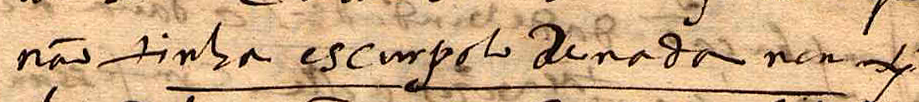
não tinha escurpolo de nada nem ty
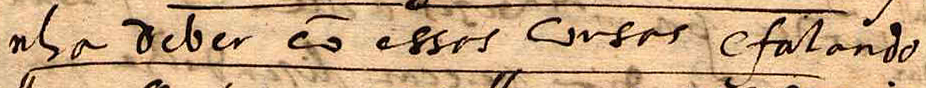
nha dever cō essas cousas e falando
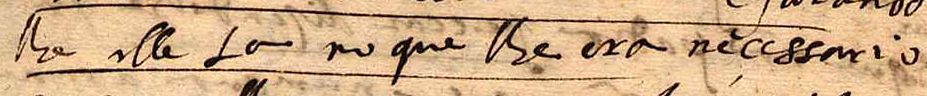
lhe elle ta no que lhe era necessario
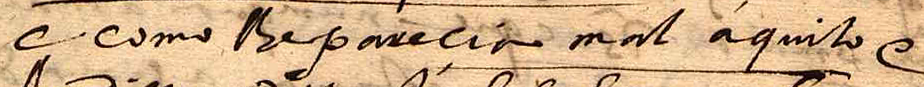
e como lhe parecia mal aquilo e
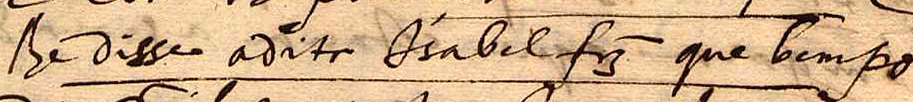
lhe disse a dita Isabel frz̄ que bem po
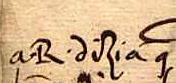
a R. dizia q̄
